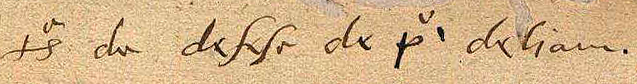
tsa da defesa de po de liam.
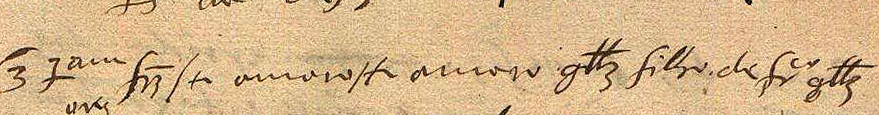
item Iam fr̄z / e amaro / e amaro gl̄lz filho de frco gl̄lz
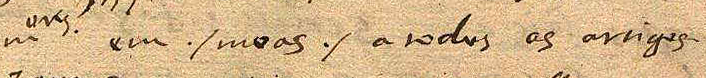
mores. em ./ moas ./ a todos os artigos
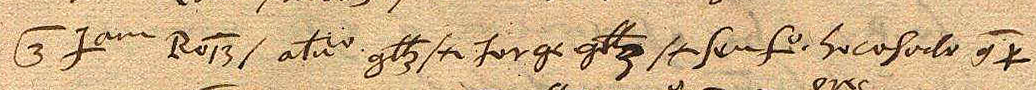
item Iam Roīz / al̄uro. gl̄lz / e Jorge gl̄lz / e seu fo. he casado q̄ ꝑ
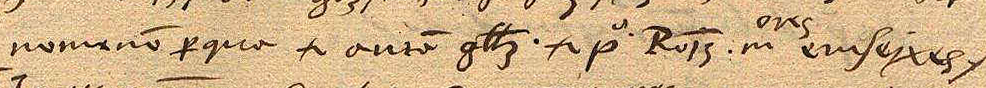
nome nō ꝑquo e antō gl̄lz. e po. Rōjz. mores em seixas /
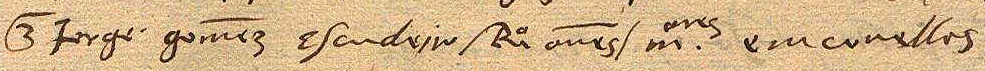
item Iorge gom̄ez Escudeiro / Ro. an̄es / m.ores em couellos
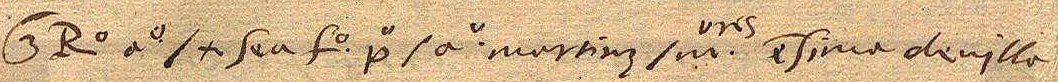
item Ro ao. / e seu fo. po / ao. martinz / m.ores ē simo de uilla
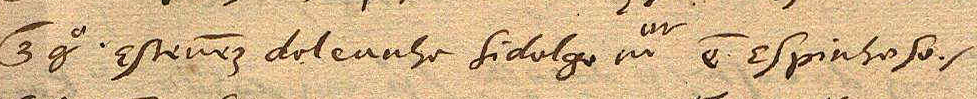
item go. Esteuēz dalcunha fidalgo mor ē Espinhoso. /
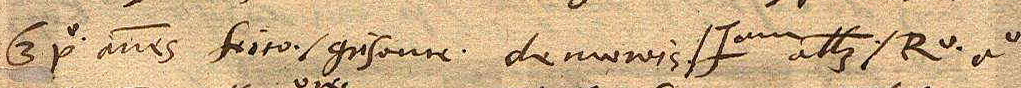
item po. an̄es feito. / grisante. de morais / Iam al̄lz. / Ro. ao
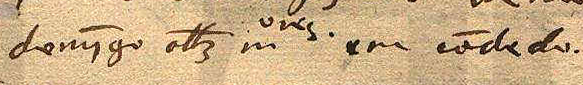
domj̄go al̄lz mores. em cādedo.
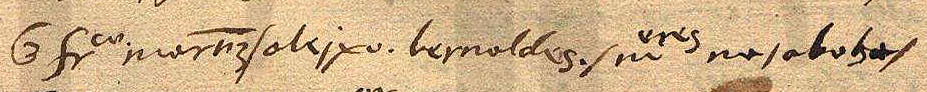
item frca martīz / alejxo. bernaldes. / mores na
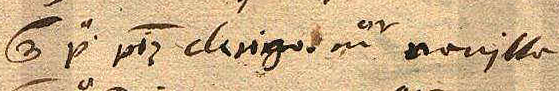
item po. p̄iz clerigo. mor na ujlla
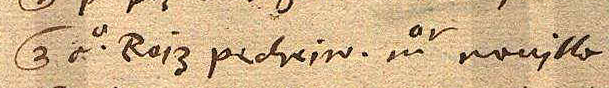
item ao. Roiz pedreiro. mor na ujlla
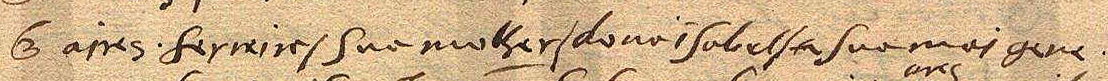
item aires. ferreira / sua molher / dona isabel / e sua mai gene
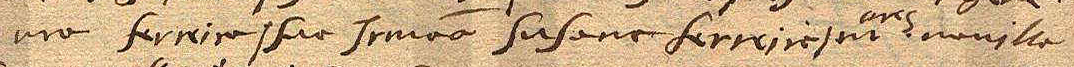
ura ferreira / sua Jrmãa SuSana ferreira / mores. na uilla
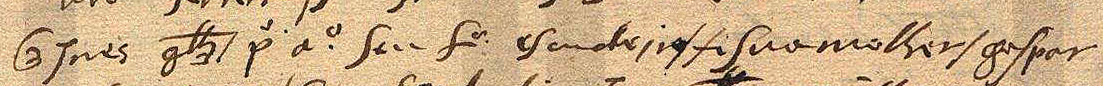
item Jnes gl̄lz / po. a.o seu fo. escudejro / e sua molher / gaspar
